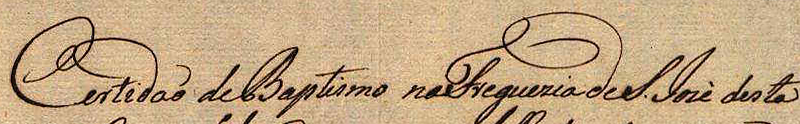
Certidaõ de Baptismo na Freguezia de S. Iozè desta
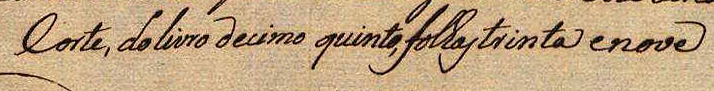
Corte, do livro decimo quinto, folhas trinta e nove
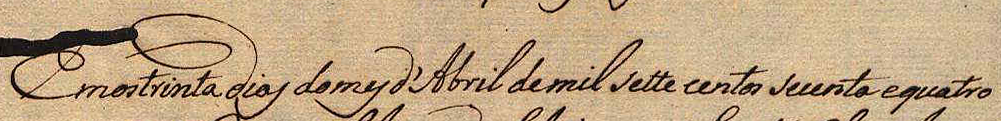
Em os trinta dias do mes d'Abril de mil settecentos secenta e quatro
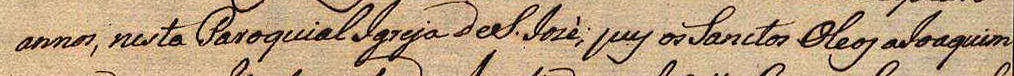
annos, nesta Paroquial Igreja de S. Iozè; pus os Sanctos Oleos a Ioaquim
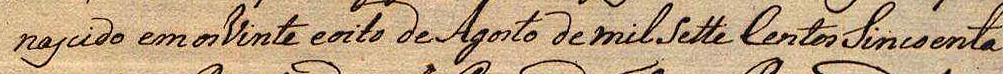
nascido em os Vinte e oito de Agosto de mil setteCentos Sincoenta
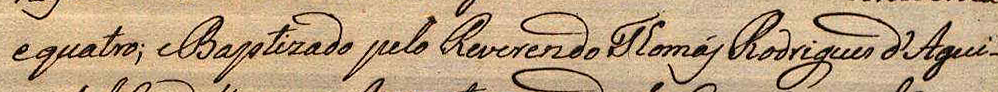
e quatro; e Baptizado pelo Reverendo Thomás Rodrigues d'Agui
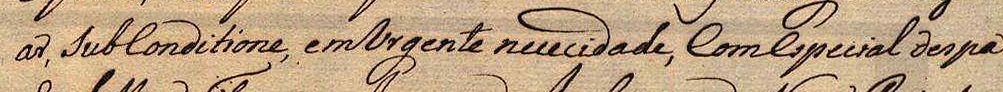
ar, sub Conditione, em Vrgente nececidade, Com especial despa
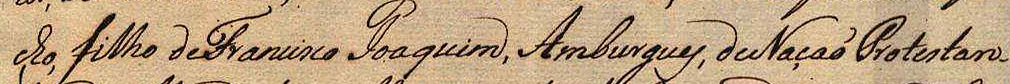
cho, filho de Francisco Ioaquim, Amburgues, de Naçaõ Protestan
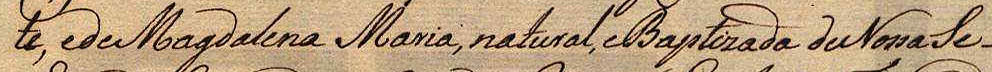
te, e de Magdalena Maria, natural, e Baptizada de Nossa Se
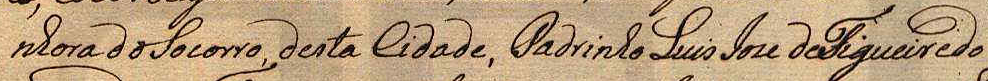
nhora do Socorro, desta Cidade, Padrinho Luis Ioze de Figueiredo
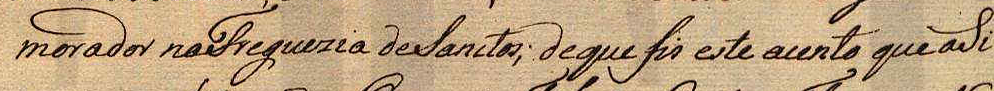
morador na Freguezia de Sanctos; de que fis este acento que aSi
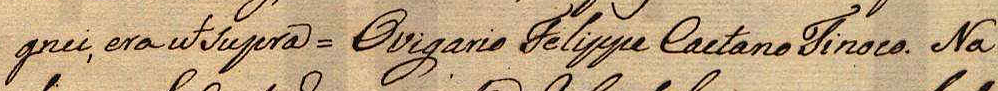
gnei, era ut supra = O vigario Felippe Caetano Tinoco. Na
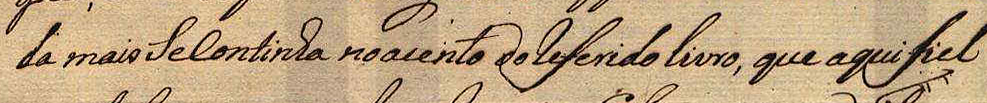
da mais Se Continha no acento do Referido livro, que aqui fiel
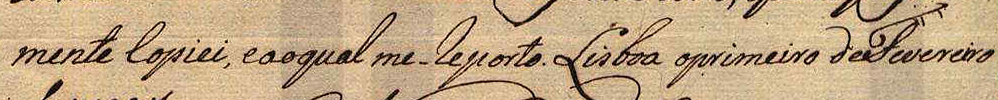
mente Copiei, e ao qual me Reporto Lisboa o primeiro de Fevereiro
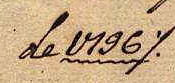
de 1796./.
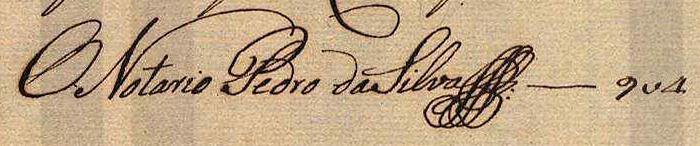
O Notario Pedro da Silva – 904
